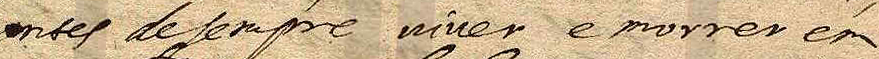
antes de sempre viuer e morrer em
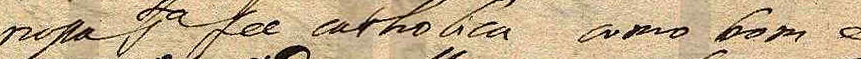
nossa S.ta fee catholica como bom e
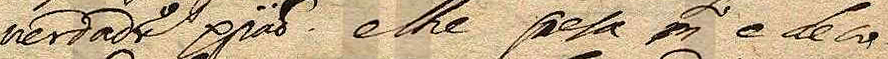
verdad.ro Xpaõ e lhe pesa m.to e de co
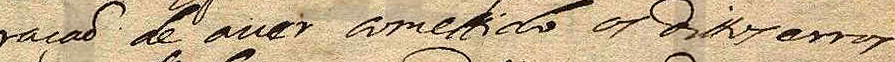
ração de auer comettido os dittos erros
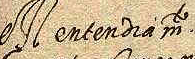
o R entendia m.to
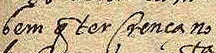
bem q̄ ter Crença no
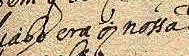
Diabo era ꝯ nossa s.ta
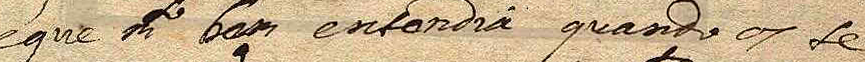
e que mto bem entendia quando os te
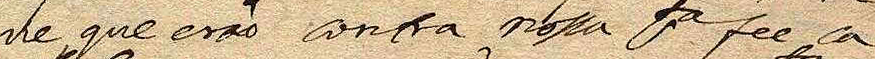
ve que eraõ contra nossa S.ta fee ca
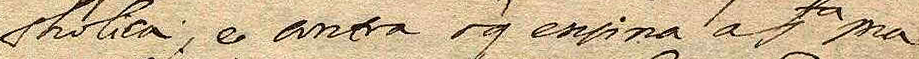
tholica; e contra o q̄ ensina a Sta ma
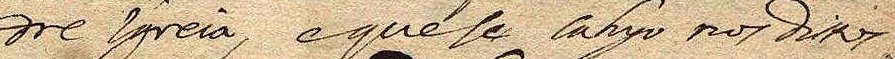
dre Igreia, e que se cahyo nos dittos
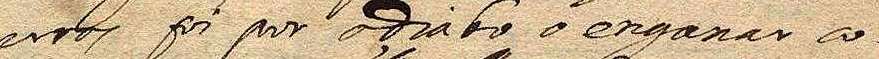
erros foi por o diabo o enganar co
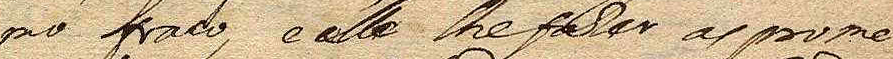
mo fraco, e elle lhe fazer as prome
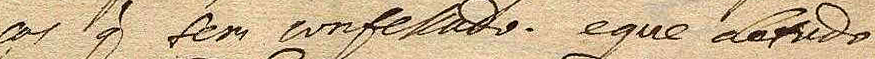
ças q̄ tem confessado. e que de tudo
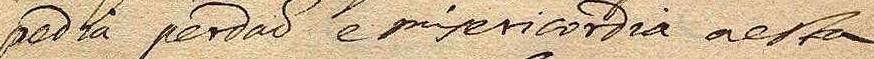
pedia perdaõ e misericordia a esta
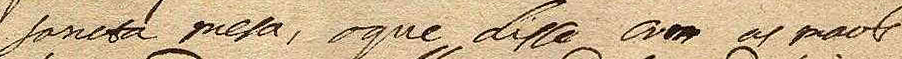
sancta mesa, o que disse com as maos̄
